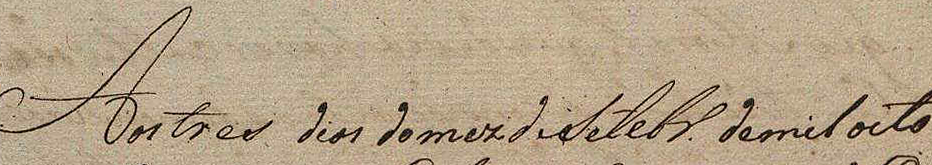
Aos tres dias do mez de Setebr.o de mil oito
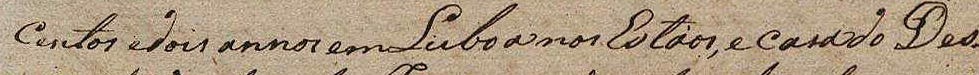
centos e dois annos em Lisboa nos Estàos, e casa do Des
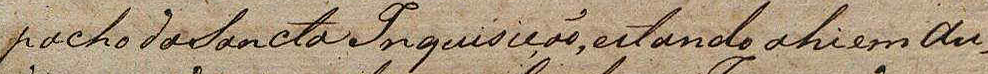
pacho da Sancta Inquisiçaõ, estando ahi em au
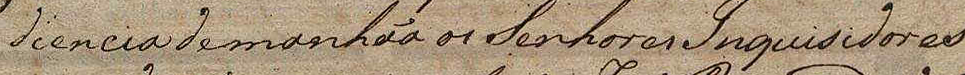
diencia de manhaã os Senhores Inquisidores
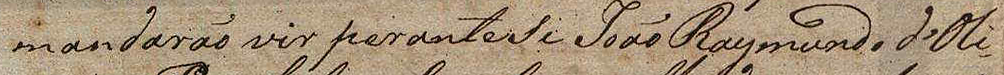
mandaraõ vir perante si Ioão Raymundo d’Oli
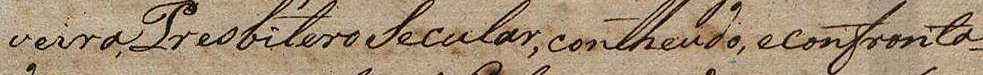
veira, Presbitero secular, conteudo, e confronta
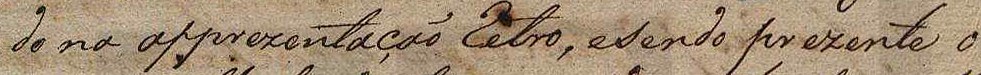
do na apprezentaçaõ Retro, e sendo prezente o
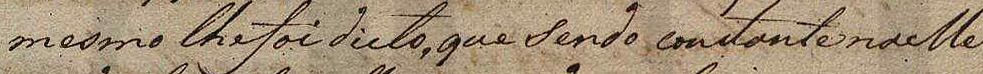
mesmo lhe foi dicto, que sendo constante na Me
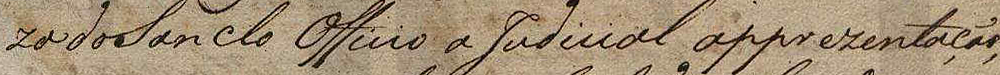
za do Sancto Officio a judicial apprezentaçaõ,
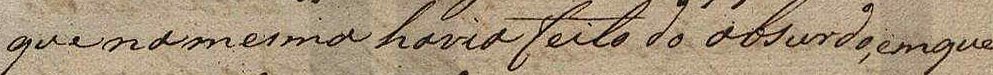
que na mesma havia feito do absurdo, em que
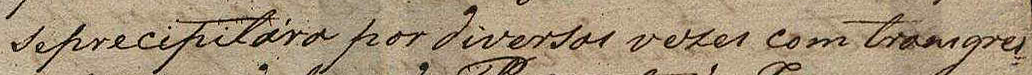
se precipitara por diversas vezes com transgres
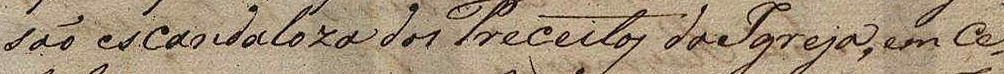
saõ escandaloza dos Preceitos da Igreja, em ce
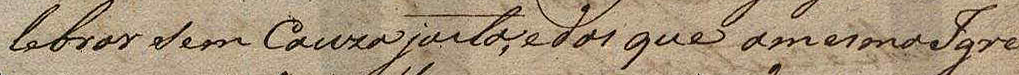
lebrar sem cauza justa, e dos que a mesma Igre
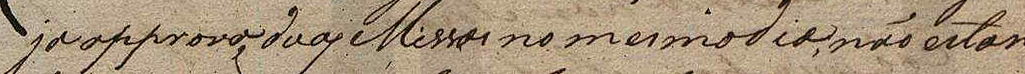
ja approva, duas Missas no mesmo dia, naõ estan
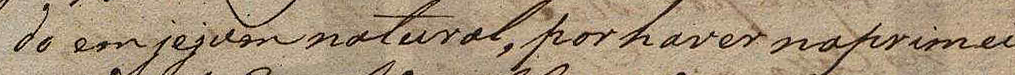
do em jejum natural, por haver na primei
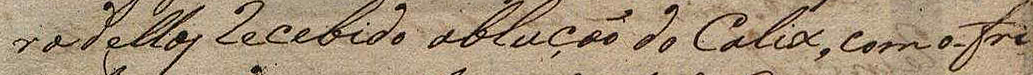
ra dellas Recebido ablução do Calix, com o fri
